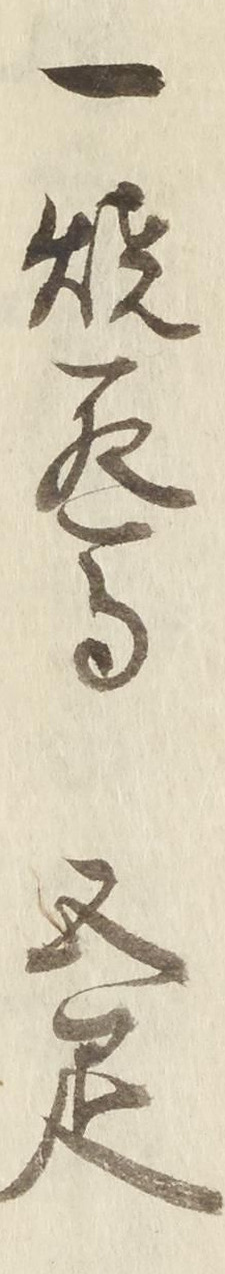一焼死馬五疋
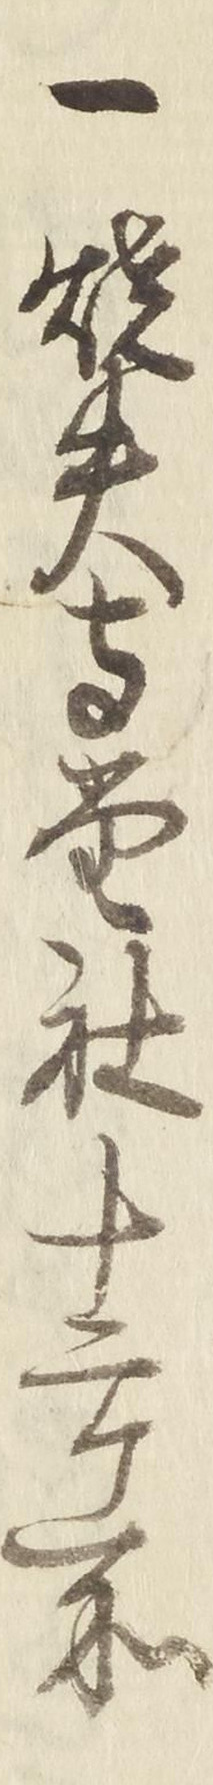一焼失寺堂社十二ヶ所
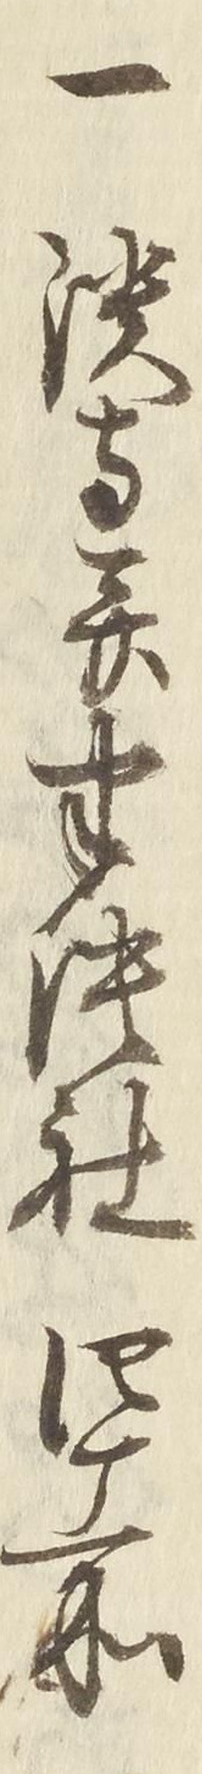一潰寺并半潰社四ヶ所
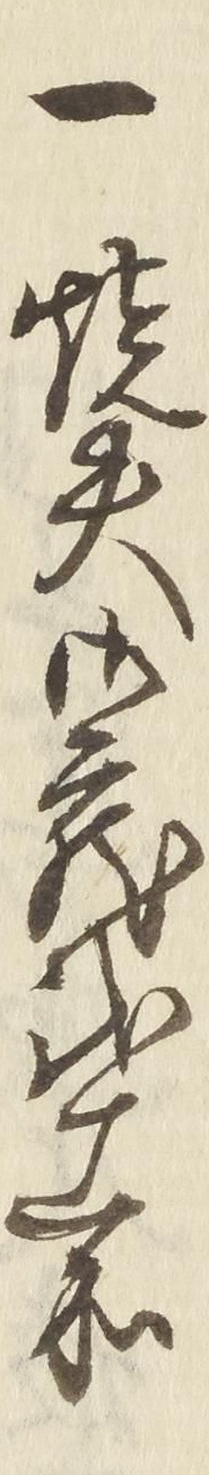一焼失御蔵弐ヶ所
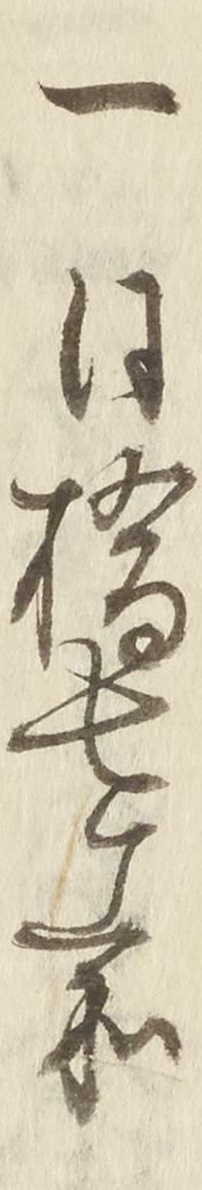一同橋七ヶ所
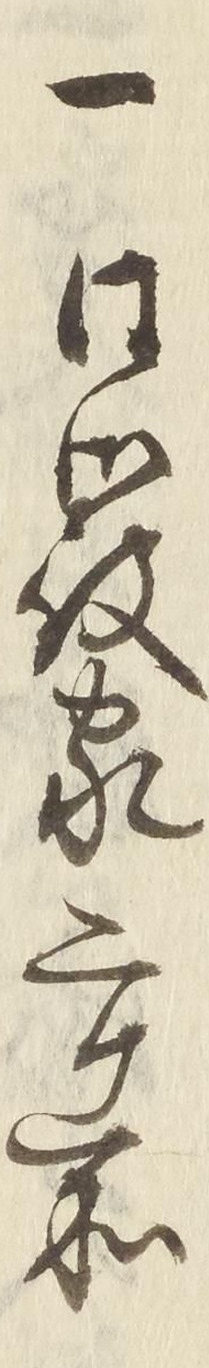一同御役家二ヶ所
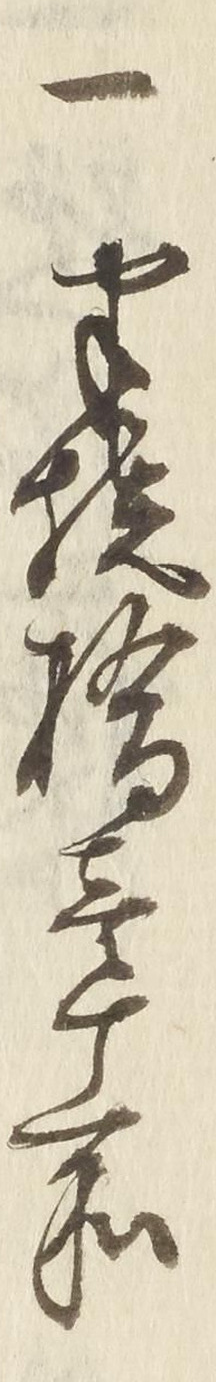一半焼橋壱ヶ所
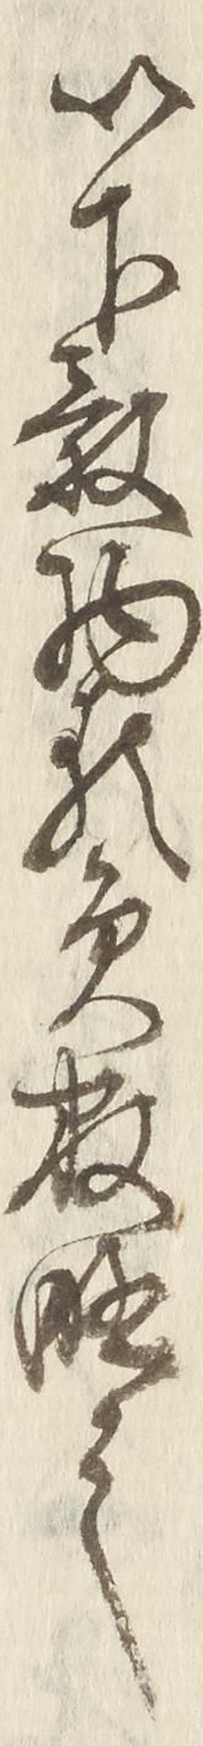以下穀者類員数略之
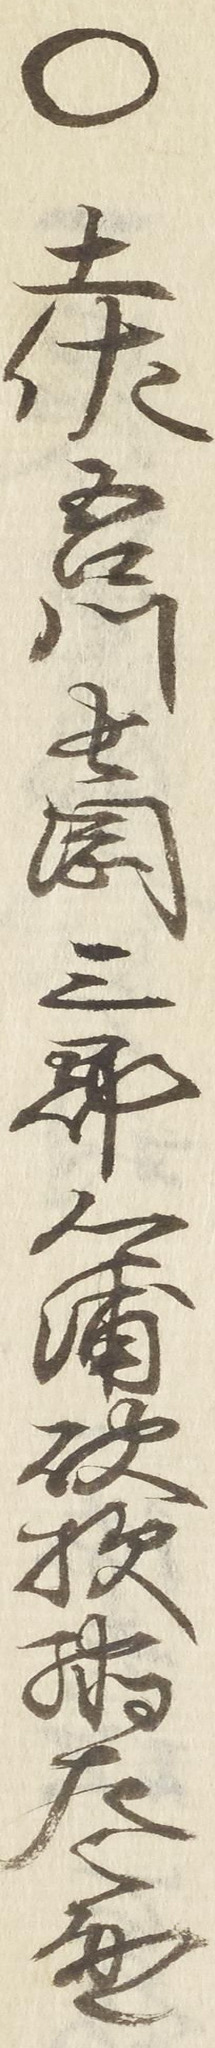◯土佐吾川長岡三郡郷浦破損縮左之通
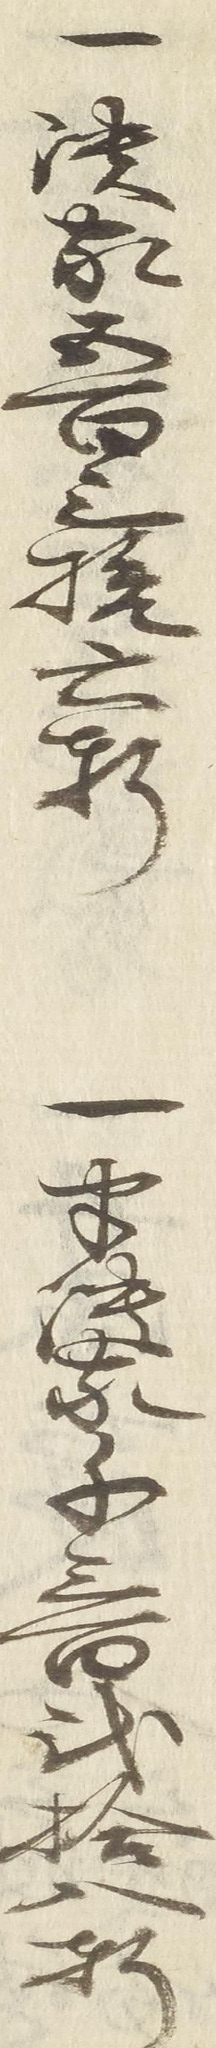一潰家五百三拾六軒一半潰家千三百弐拾八軒
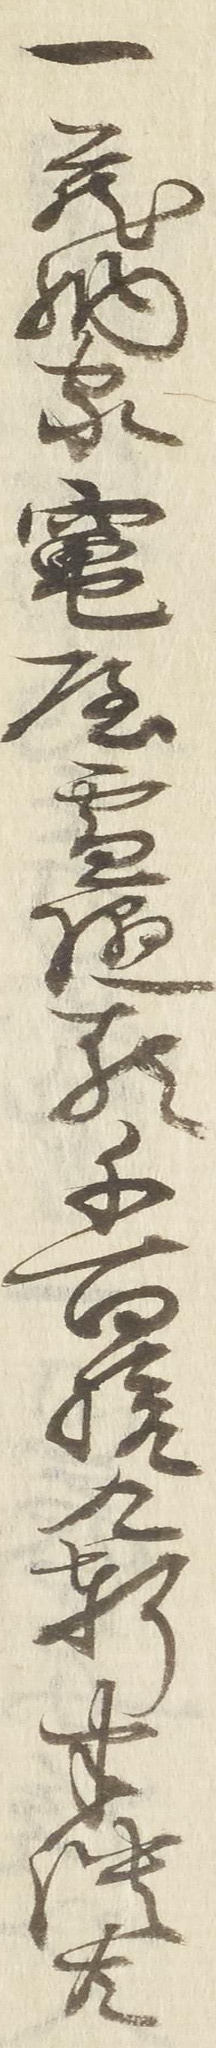一蔵納屋竈屋雪隠類千百拾九軒半潰共
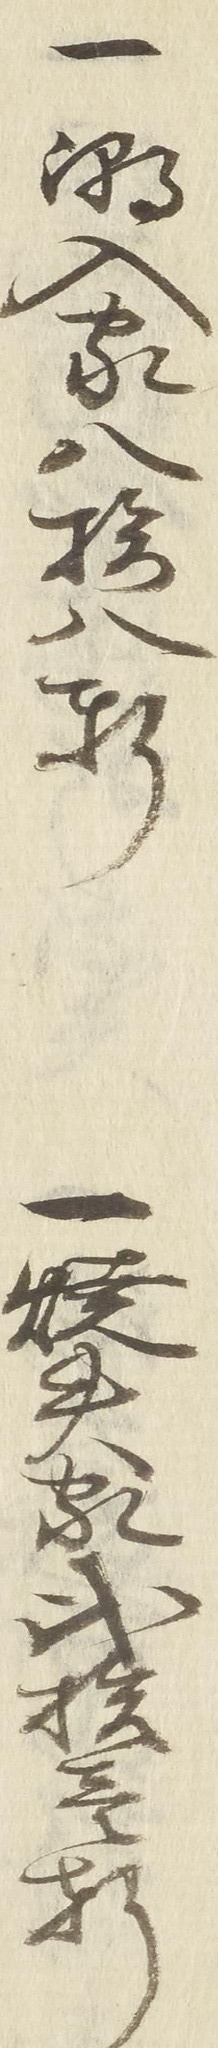一潮入家八拾八軒一焼失家弐拾壱軒

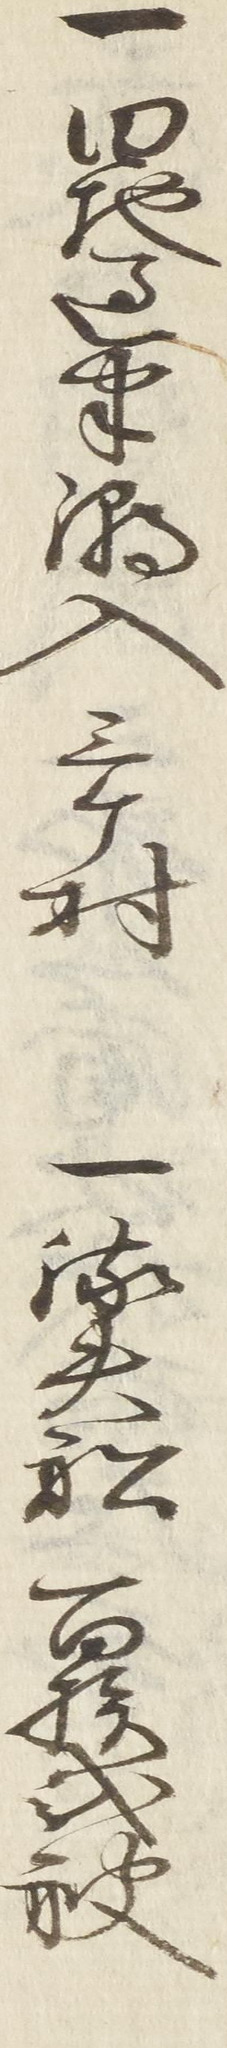一田地過半潮入三ヶ村一流失船百拾弐艘
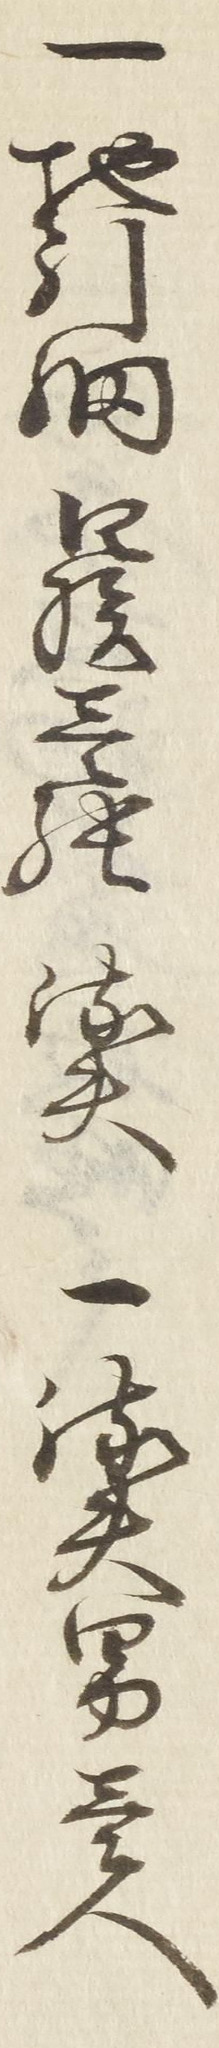一地引網四拾壱張流失一流失男壱人
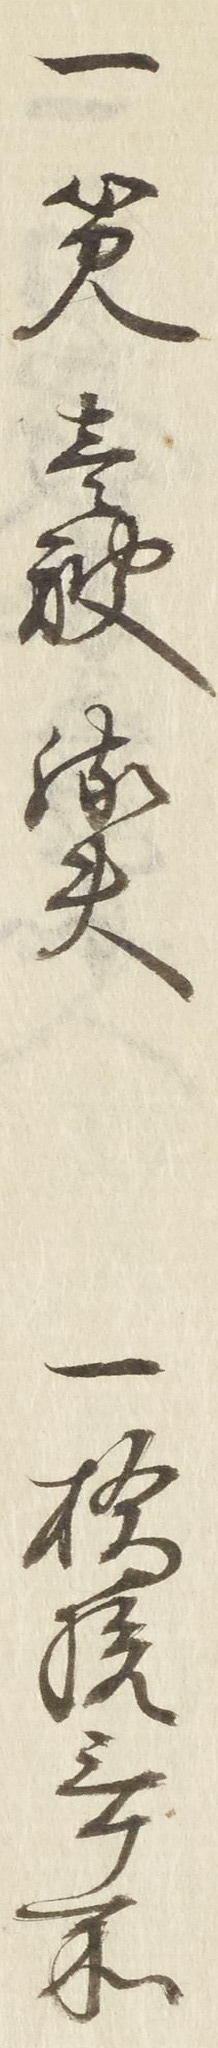一筧壱艘流失一橋三ヶ所
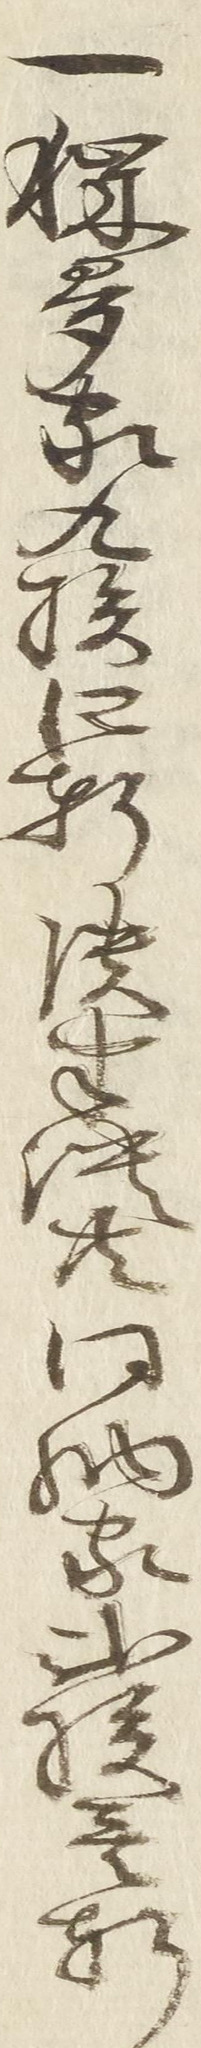一穢多家九拾四軒潰半潰共同納家弐拾壱軒
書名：地震記　下
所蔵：東京大学地震研究所図書室 Earthquake Research Institute Library, The University of Tokyo, JAPAN
